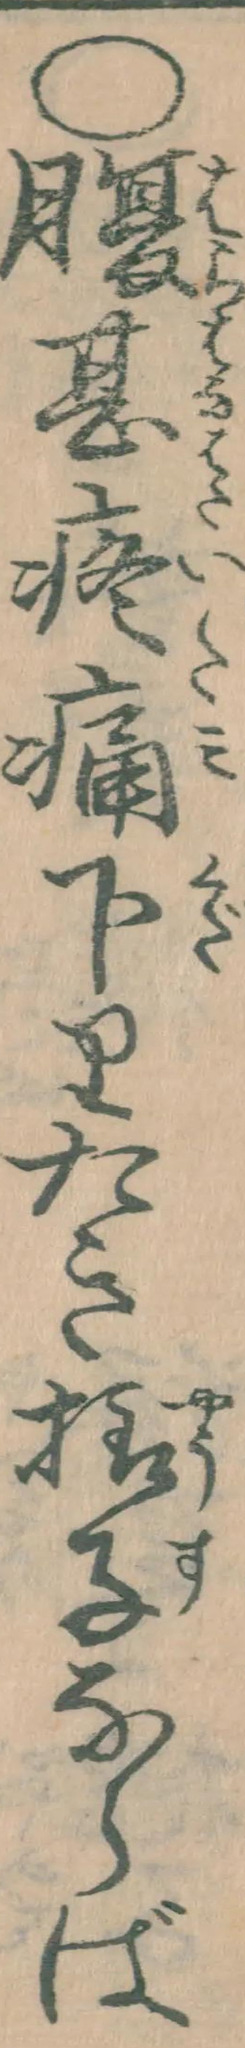〇腹甚疼痛下りたき様子ならば
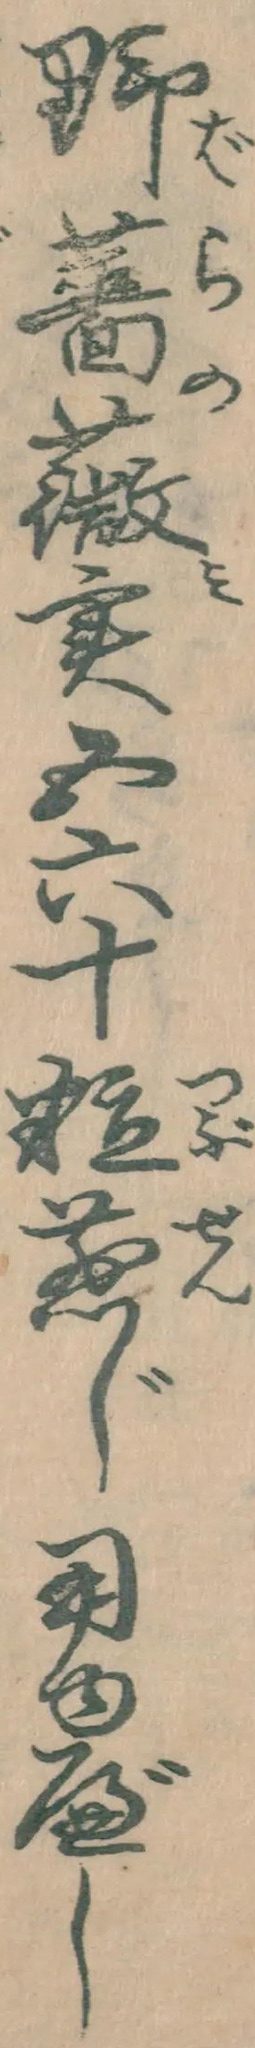野薔薇実五六十粒煎じ用ゆべし
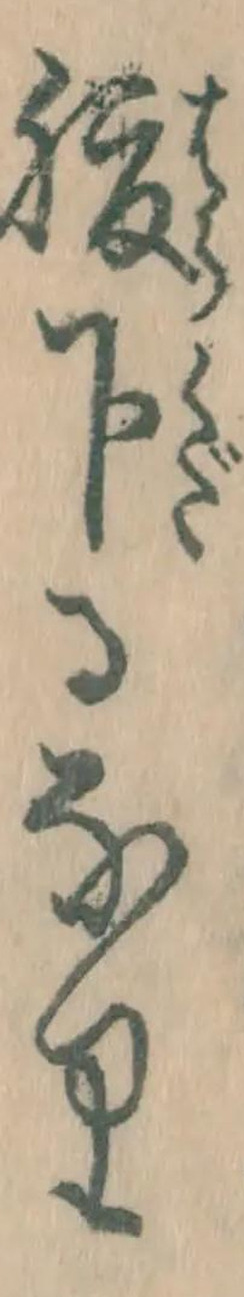腹下るなり

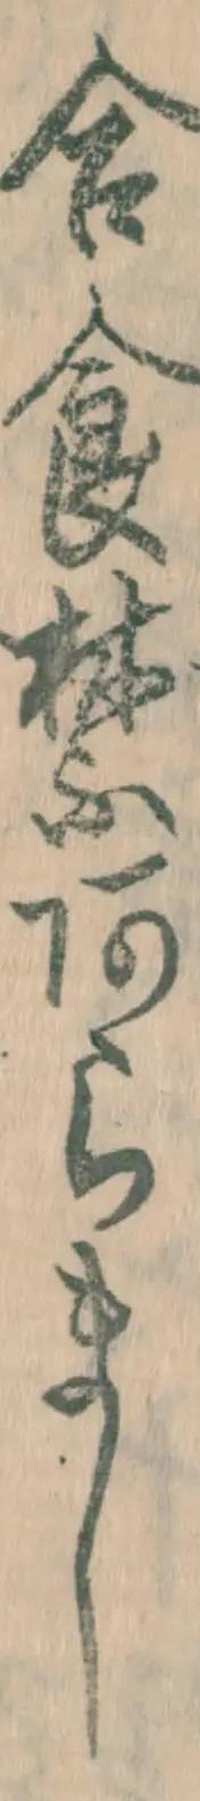合食禁あらまし
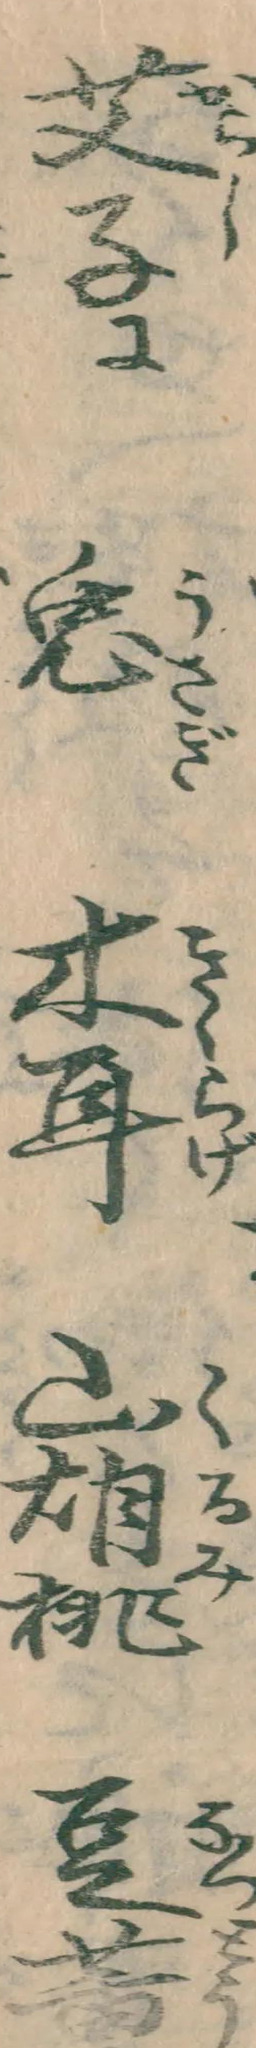艾子に兎木耳山胡桃豆
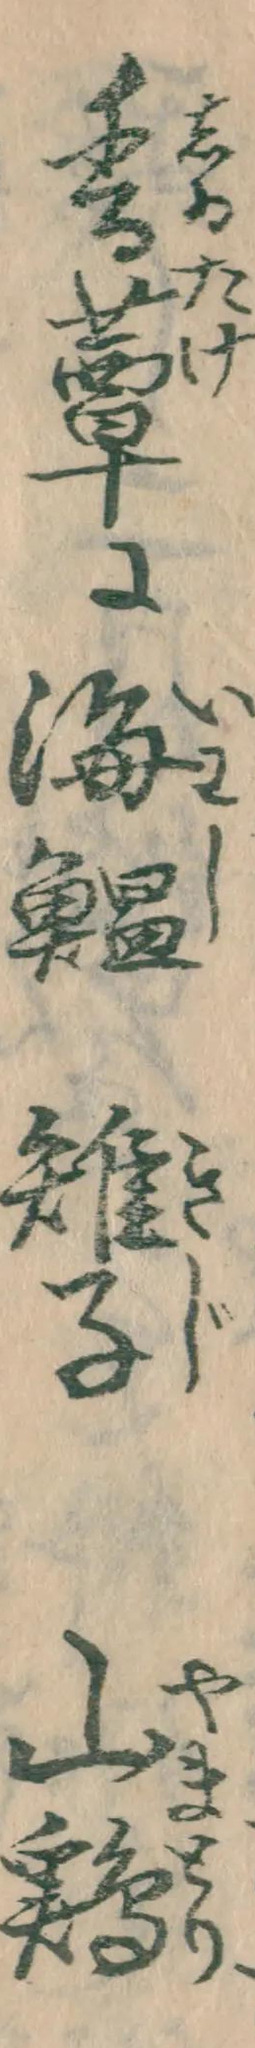香蕈に海鰮雉子山鶏
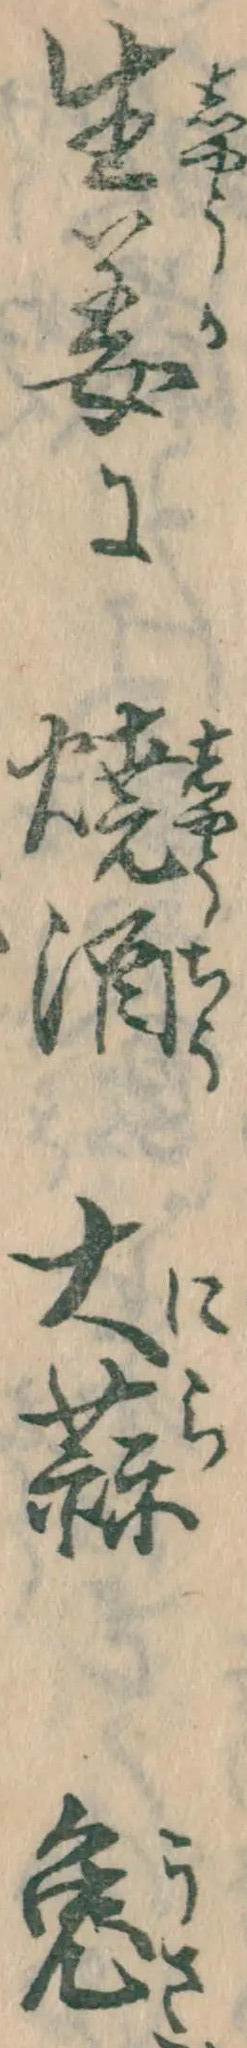生姜に焼酒大蒜兎
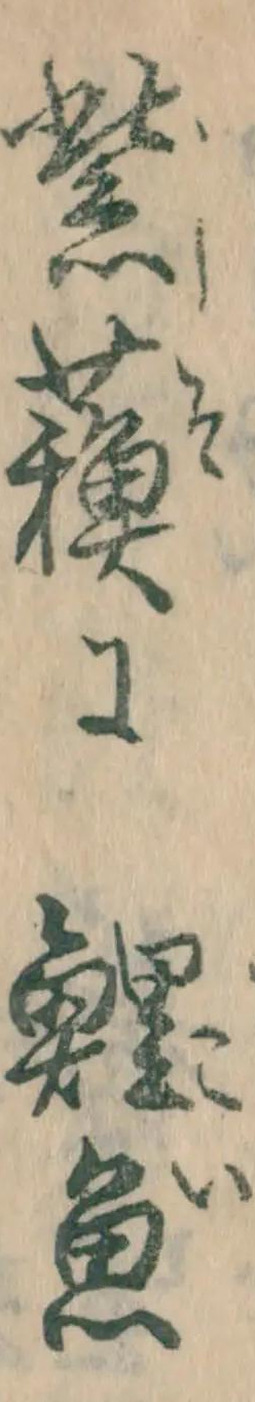紫蘇に鯉魚

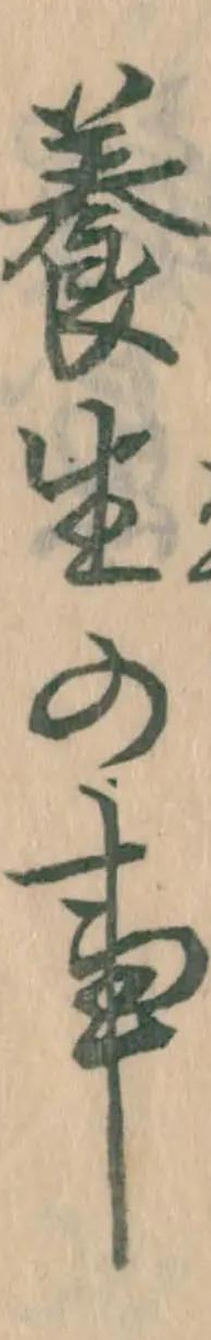養生の事
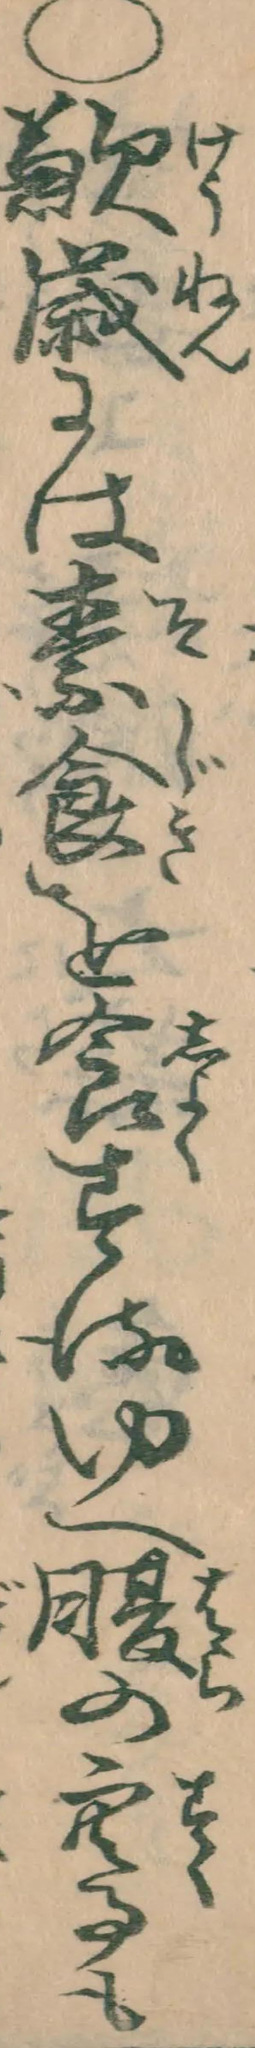〇歉歳には素食を食するゆへ腹の空ことも
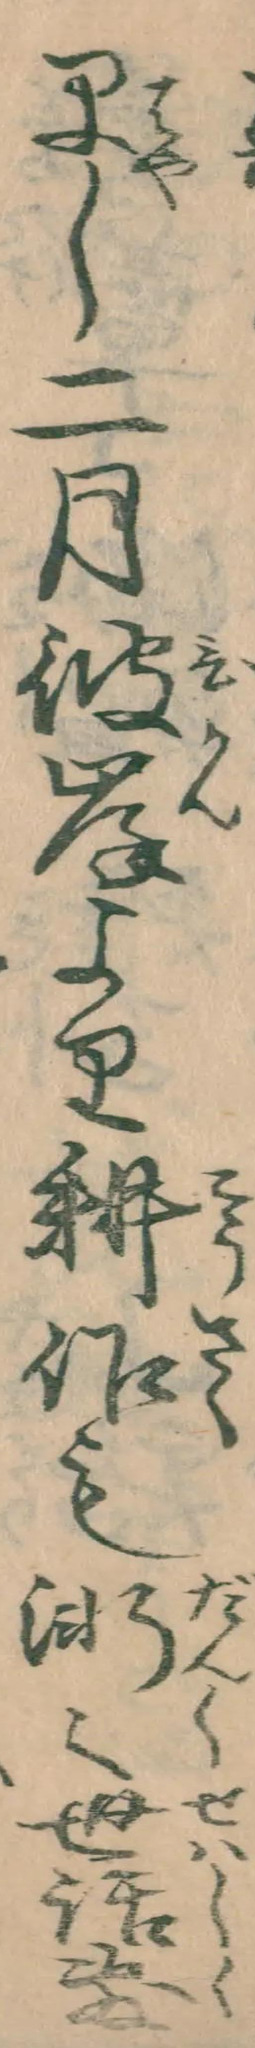早し二月彼岸より耕作も漸ゝ世話敷
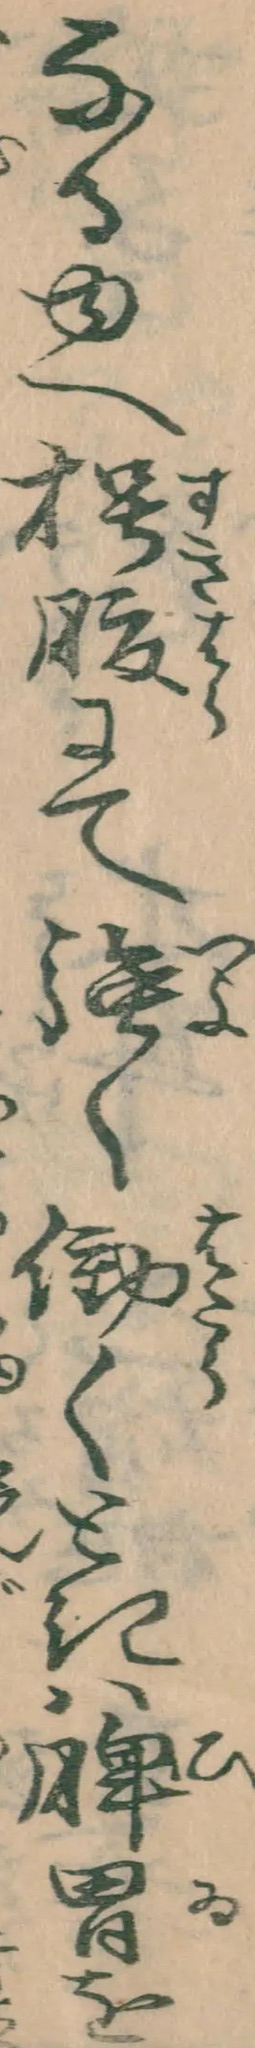なるゆへ腹にて強く働くと記は脾胃を
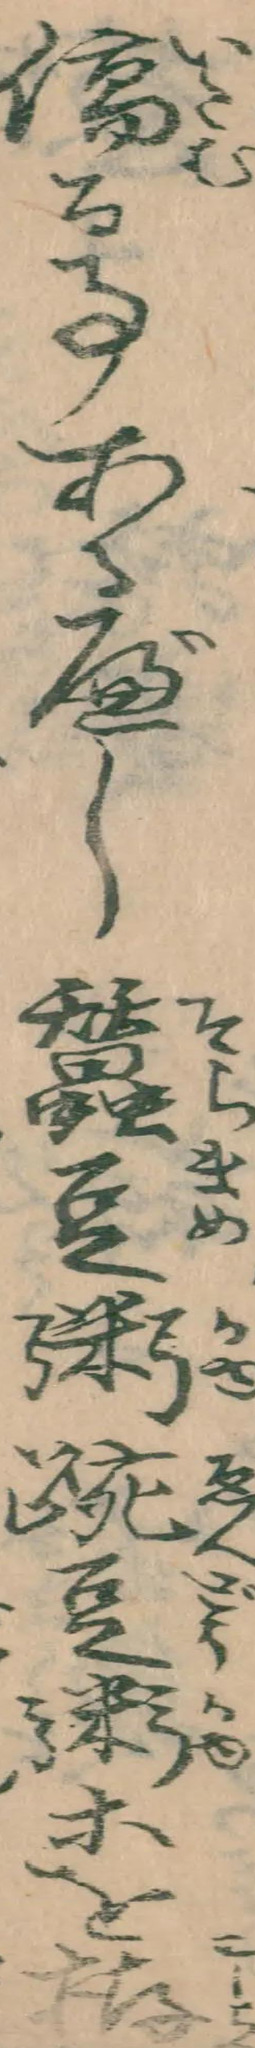傷る事あるべし蠶豆粥踠豆粥等を拵
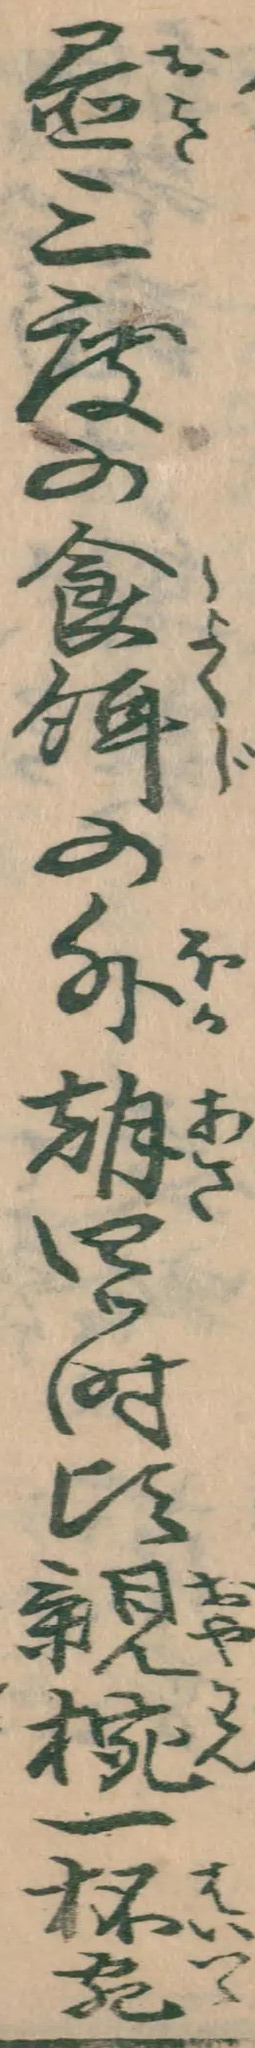置三度の食餌の外朝四ッ時頃親椀一杯宛
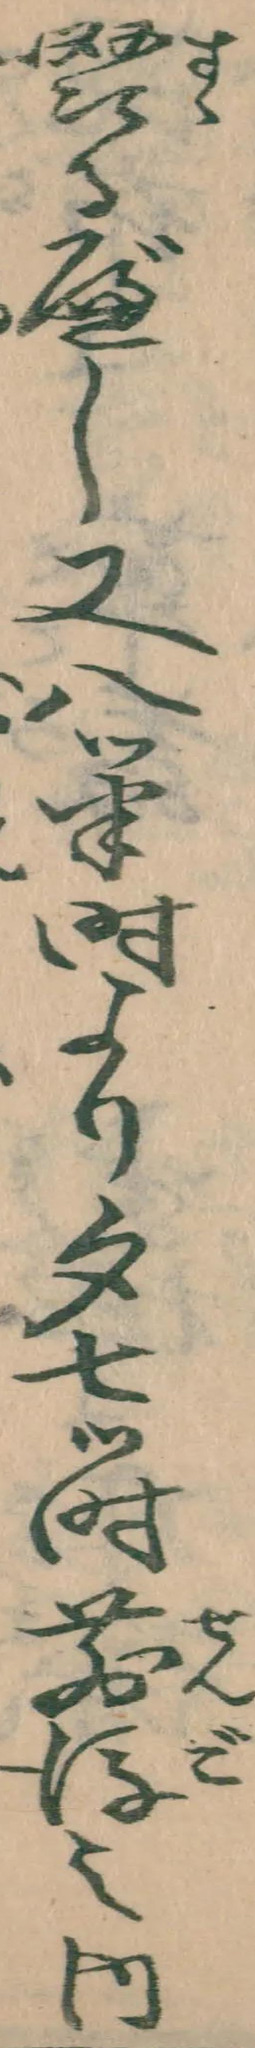啜るべし又八ッ半時より夕七ッ時前後の内
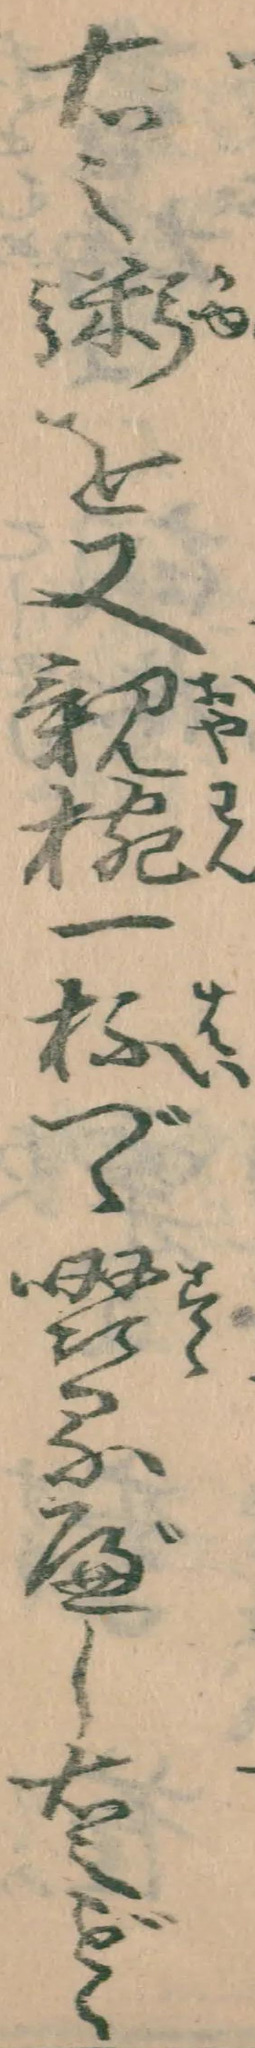右の粥を又親椀一杯づゝ啜るべし右のごとく
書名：救荒鄙諭
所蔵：国立国会図書館 National Diet Library, JAPAN
